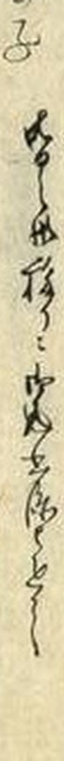昨日之御移りニ御返書添被進之
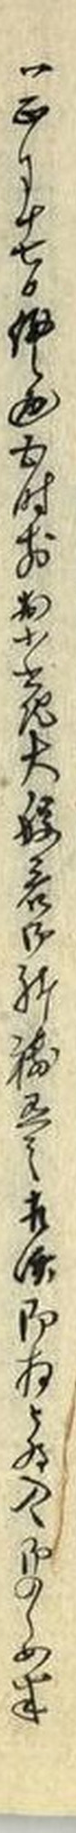一正月十七日例之通五時前於小書院大般若御祈祷有之相済御拝被為入候
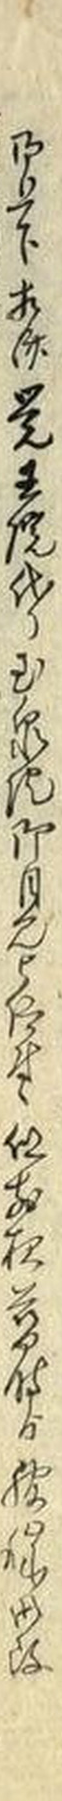御上下相済覚王院代り玉泉院御目見被仰付候但前夜暮時ゟ服穢御改
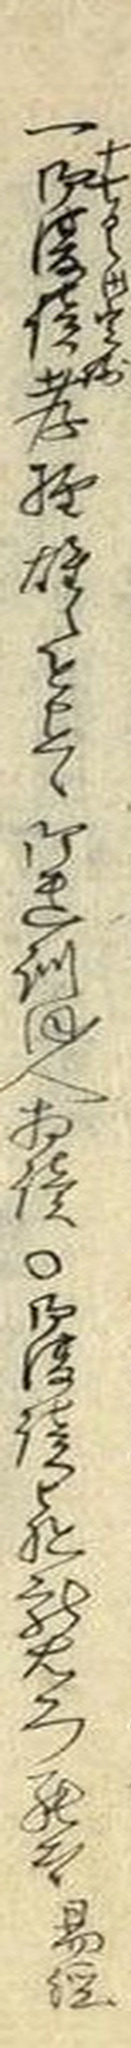一御復読孝経雄之進申上候御遣訓同人拝読○御復読被遊新右衛門罷出候易経
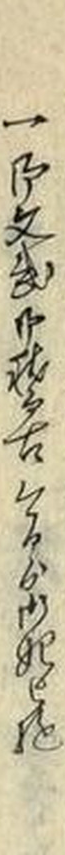一御文武御稽古今日ゟ御始被遊
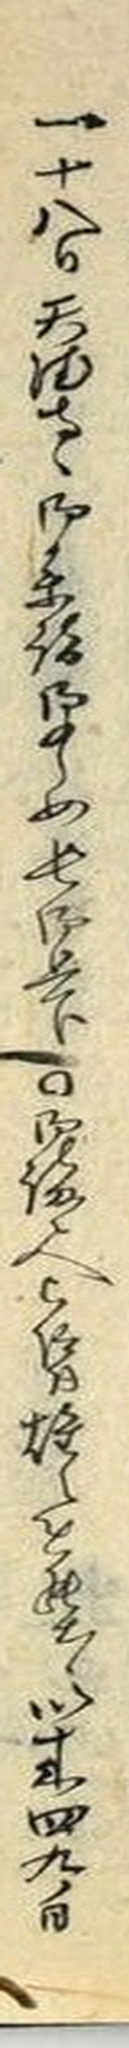一十八日天徳寺へ御参詣御のしめ長御上下○御講尺被仰付雄之進罷出候以来四九之日
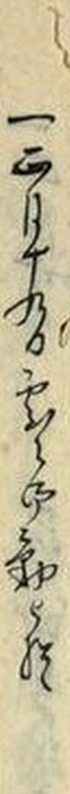一正月十九日処々御勤被遊候

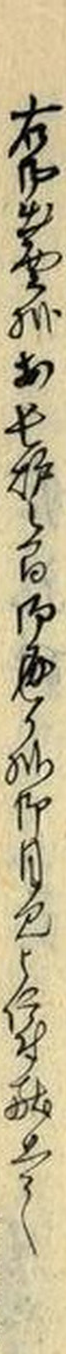右御出殿掛於長炉之間御通掛御目見被仰付献上之
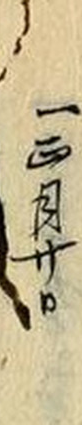一正月廿日
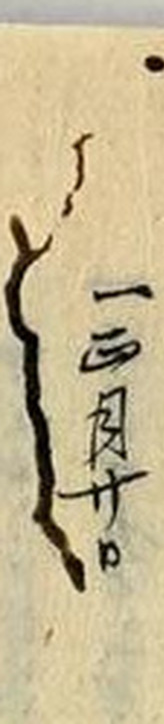一正月廿日
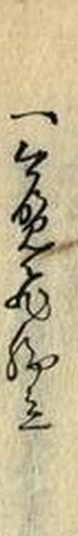一今晩飛脚立
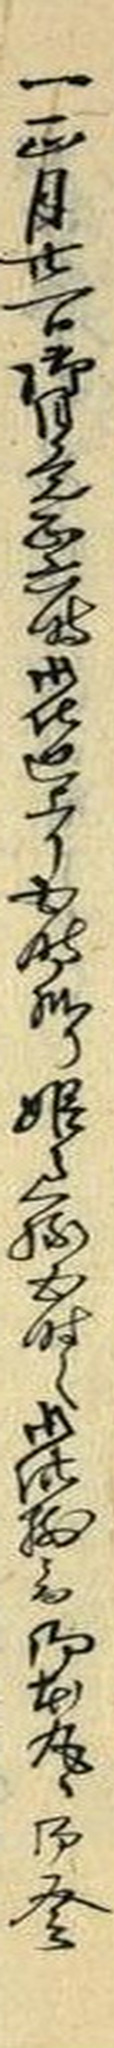一正月廿一日御目覚正六時御仕廻上り五時掛り姫君様五時之御供揃ニ而御本丸へ御登
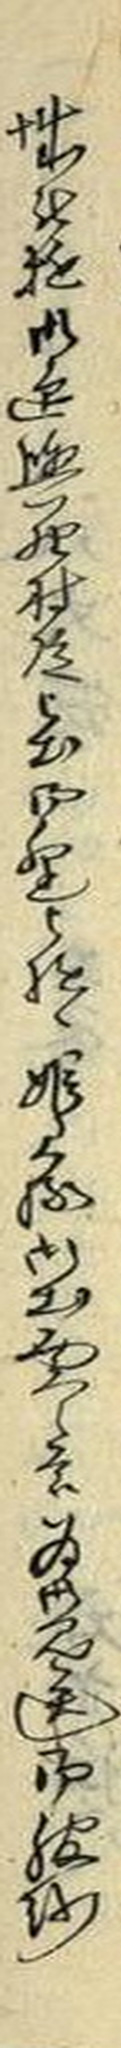城被遊御迎輿野村殿被出御逢被遊候姫君様御出殿之節為御見送御服紗
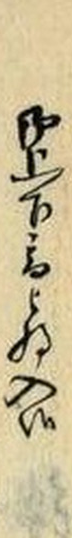御上下ニ而被為入候
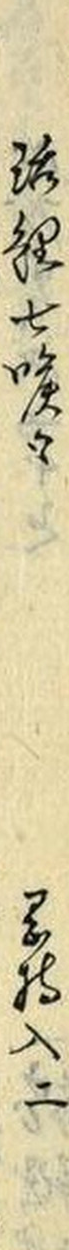活鯉七喉ツゝ岡持入二
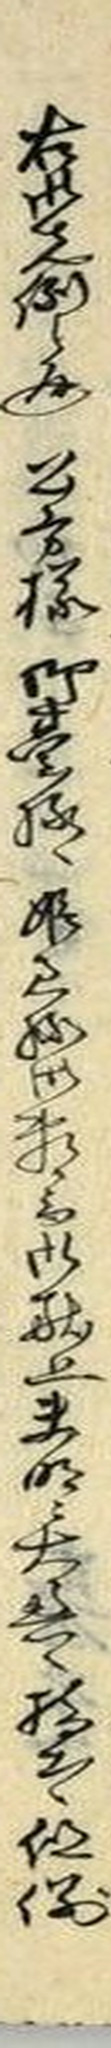右御先例之通公方様御台様へ姫君様御頼ニ而御献上未明ニ大奥へ指出候但例
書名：少傅日録抄（斉承付側向頭取日記、在府）
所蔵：福井県文書館 Fukui Prefectural Archives
